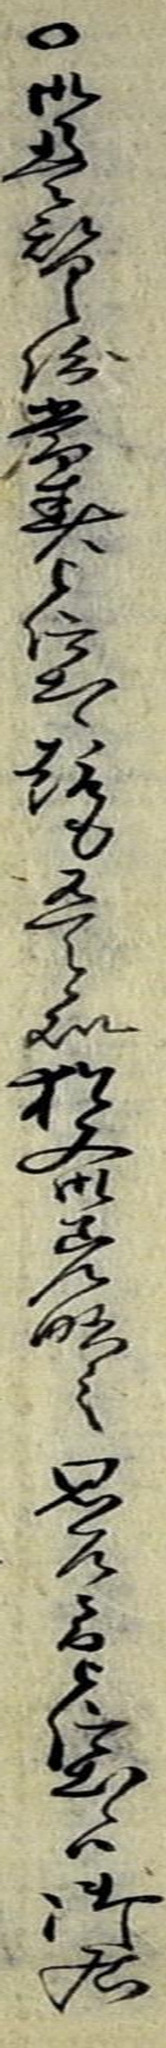〇御畳替之儀当春被仰出候趣も有之候処猶又御差略之思召に付被仰出候は御居
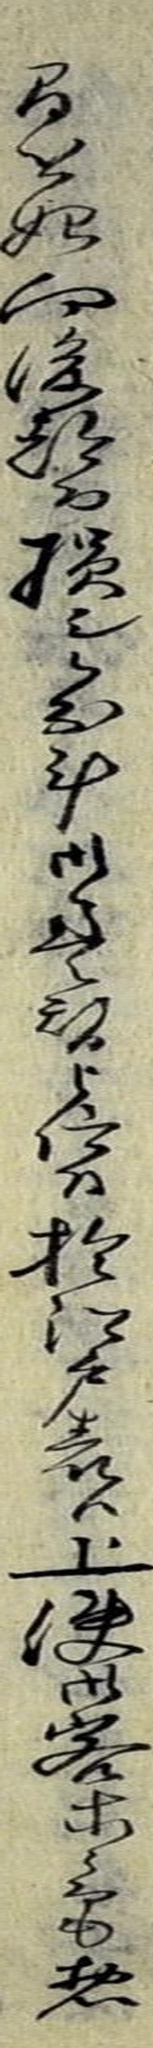間を始向後都而損し候分斗御畳替被仰付於江戸表は上使御客等に而も惣
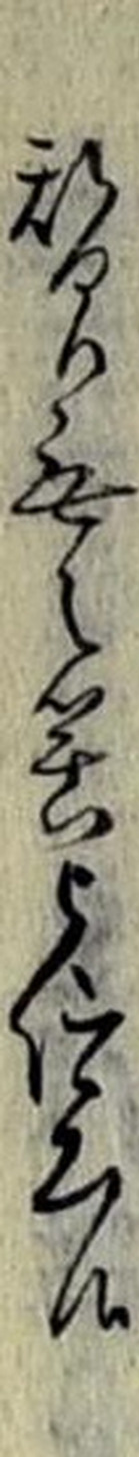替は無之筈被仰出候
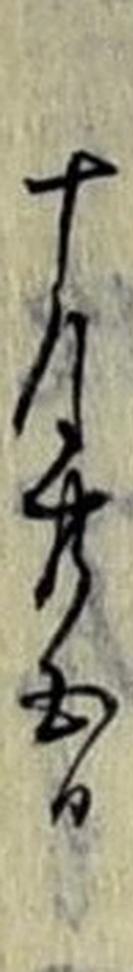十月廿五日
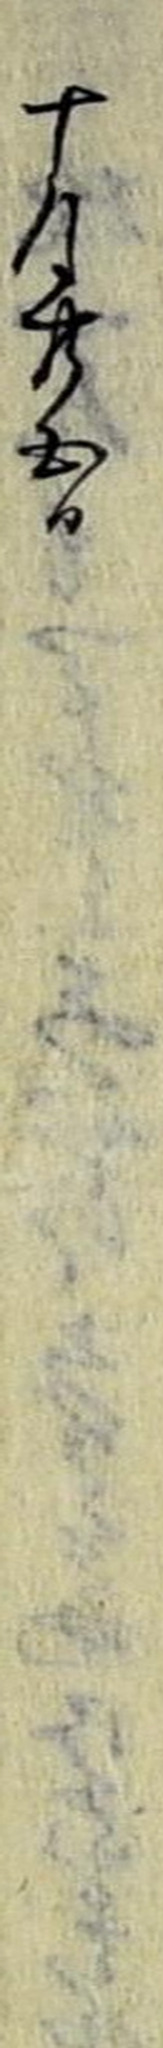十月廿五日
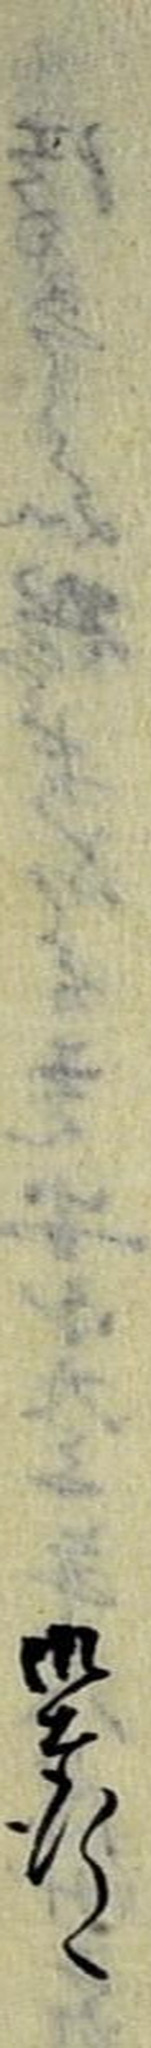御奉行へ
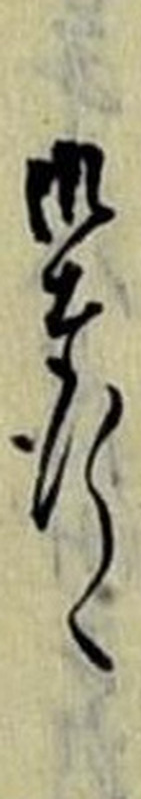御奉行へ
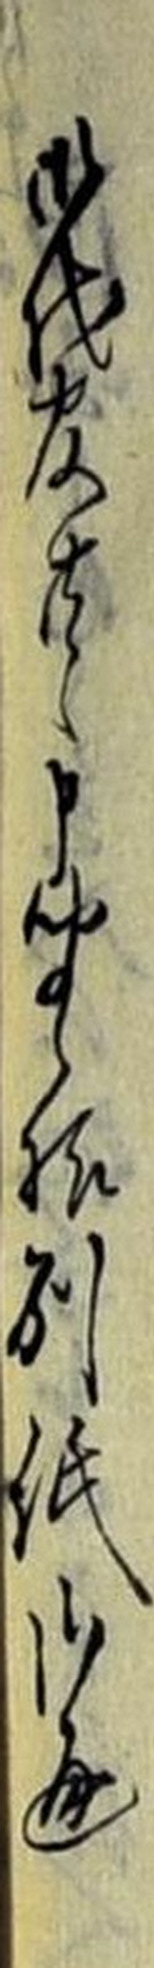御代官共へ申聞候様別紙弐通
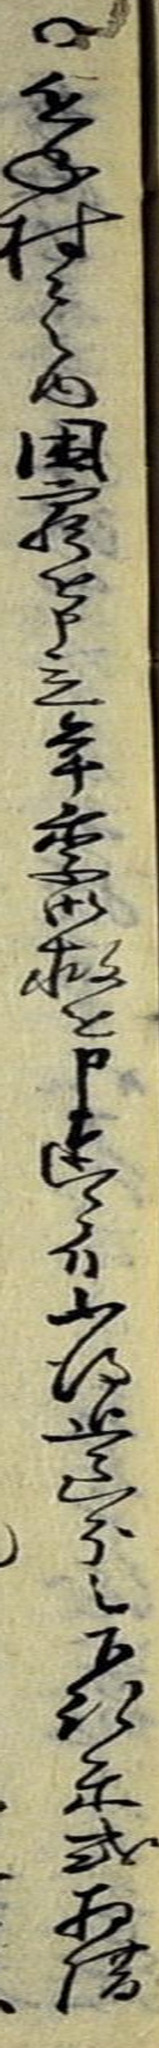〇近年村々之内困窮を申立年季御救を申達候に付不得止過分之下行米或拝借
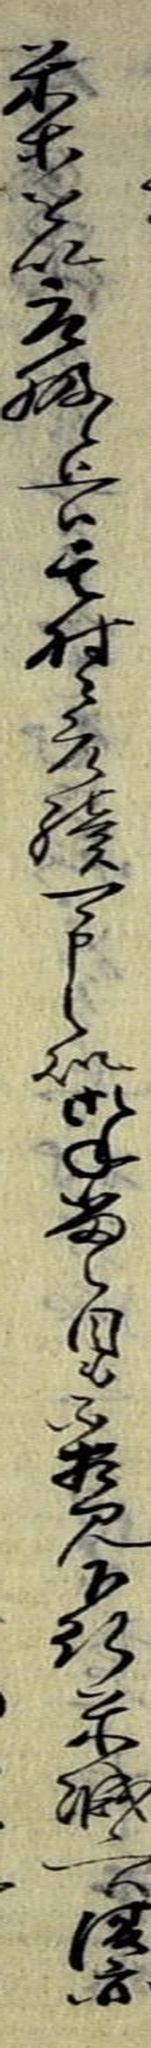米等を以取扱候上は其村々取続可申之処御手当之目も不相見下行米減候へは復亦
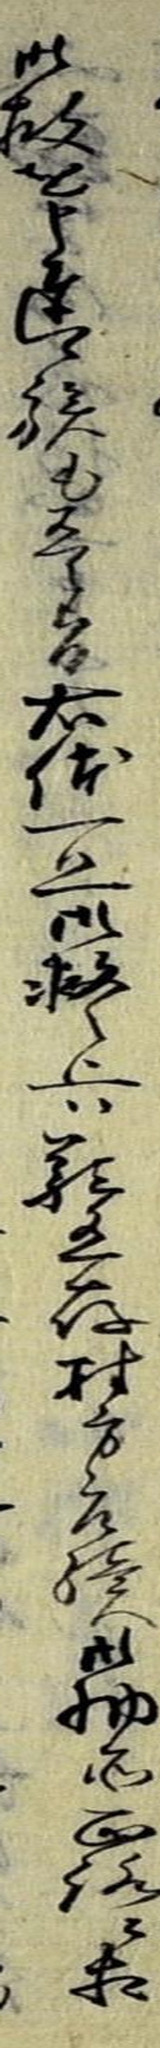御救を申達候族も有之旨右体一旦御救之上は難有存村方取続御納所正路に相
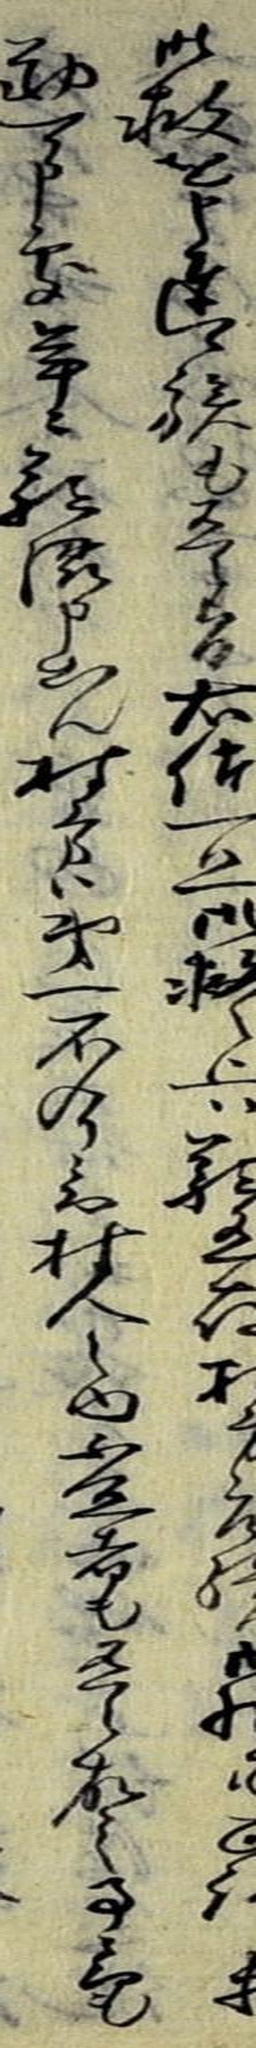勤可申処年々難渋申出る村方は第一不〆りに而村人之内不宜者も有之故之事に而も
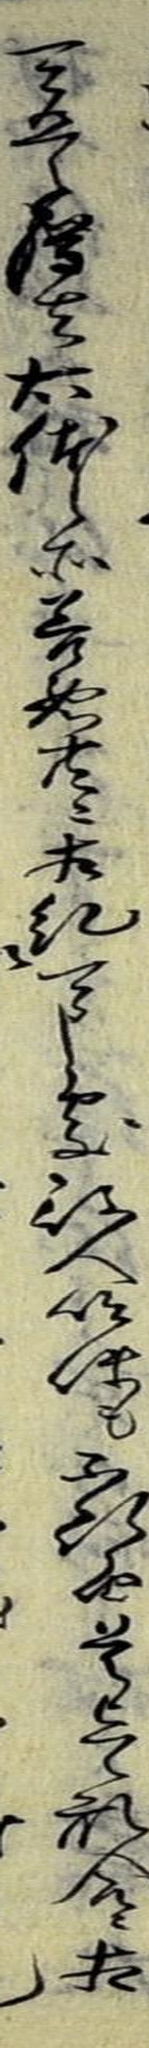可有之得は右体之所善悪共に相糺可申処役人吟味も不行届是迄之形合に相
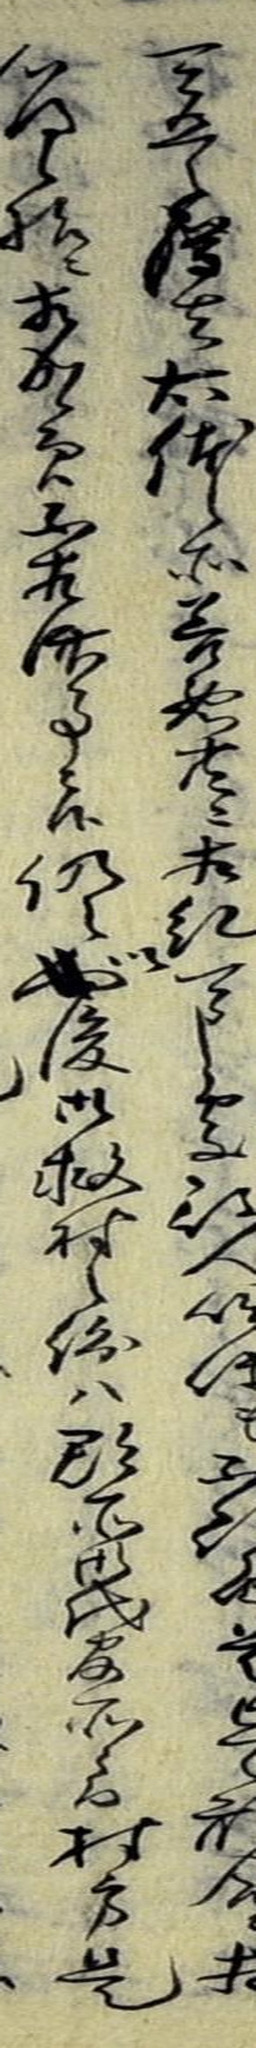心得候様に相成候而は不相済事に候仍之向以後御救村之儀は郡所御代官所に而村方是
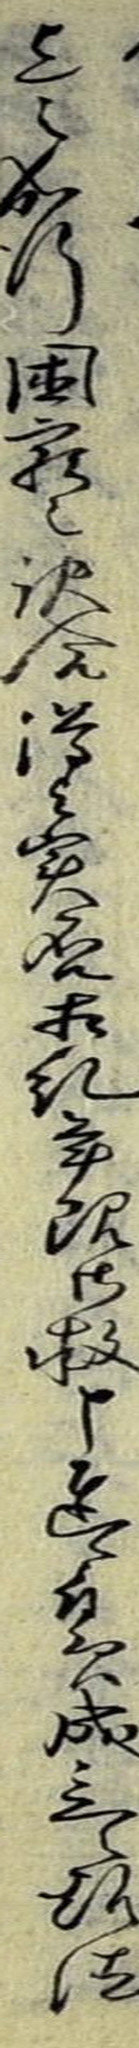迄之成行困窮之訳合得与実不否相糺年限御救申達候に付而は成立之趣法
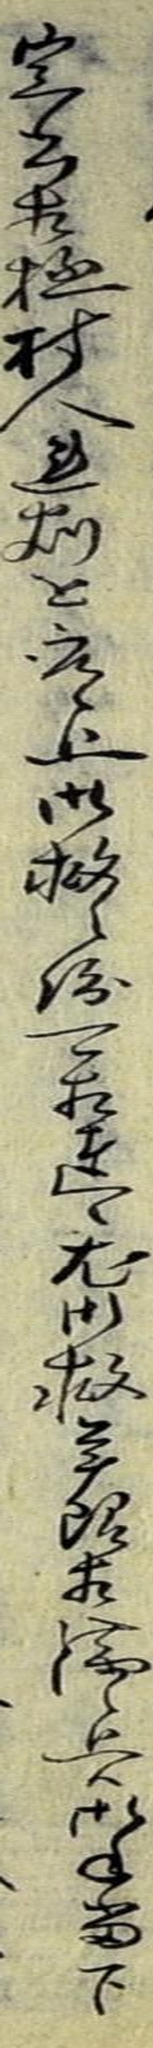定書相極村人連判を取候上御救之儀可相達候尤御救年限相満候上は御手当下
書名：命令之部 二
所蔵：福井県文書館 Fukui Prefectural Archives
